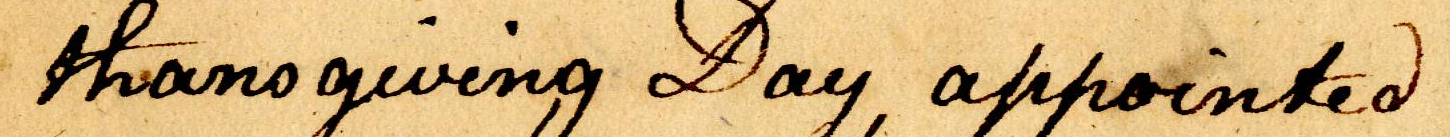thansgiving Day, appointed
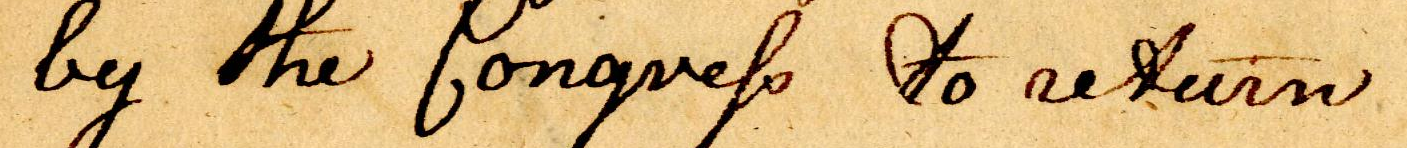by the Congress to return
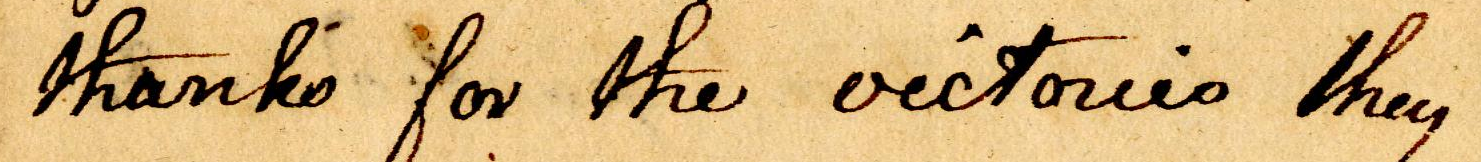thanks for the victories they
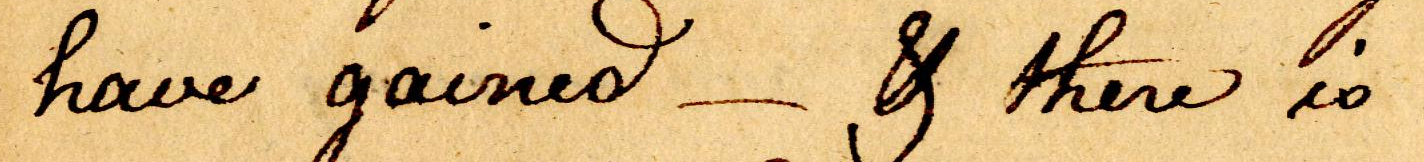have gained- & there is
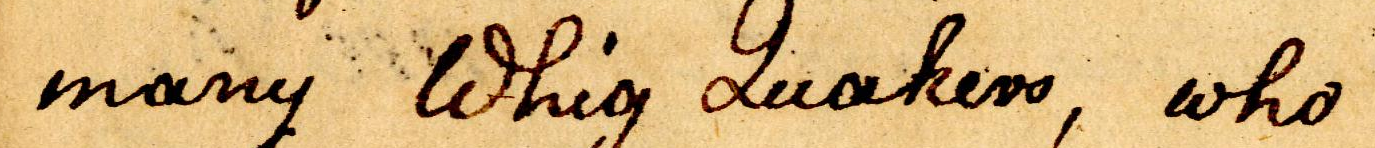many Whig Quakers, who
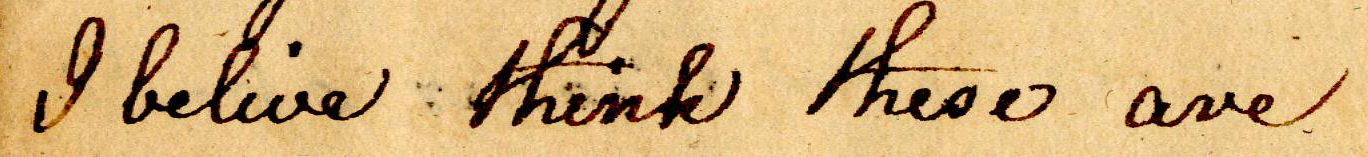I belive think these are
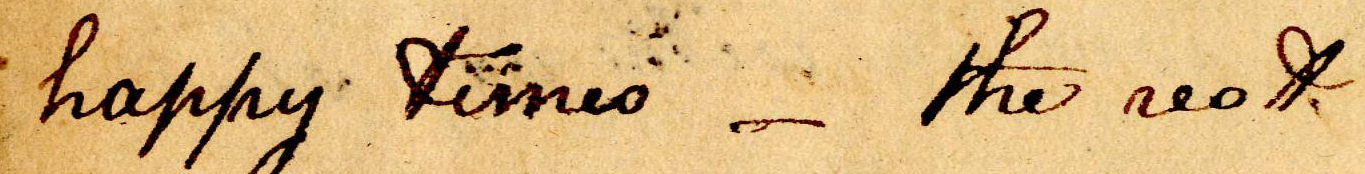happy times- the rest
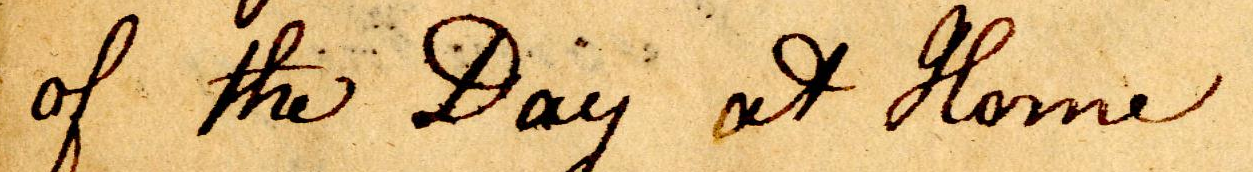of the Day at Home
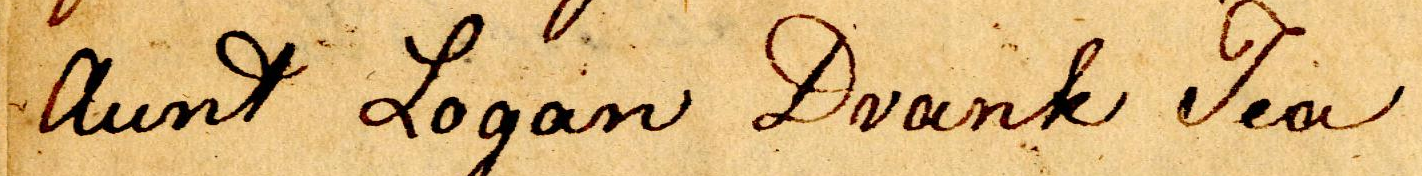Aunt Logan Drank Tea
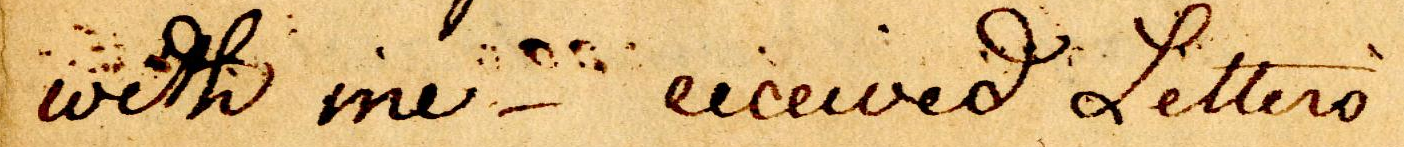with me- received Letters
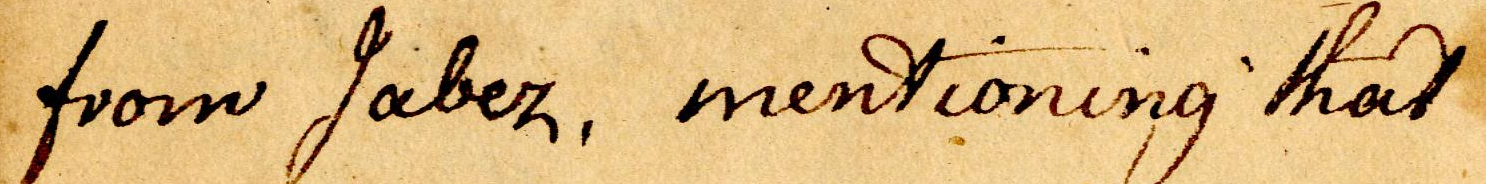from Jabez, mentioning that
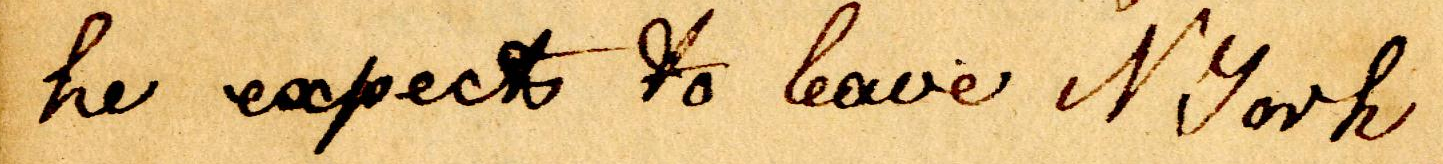he expects to leave N York
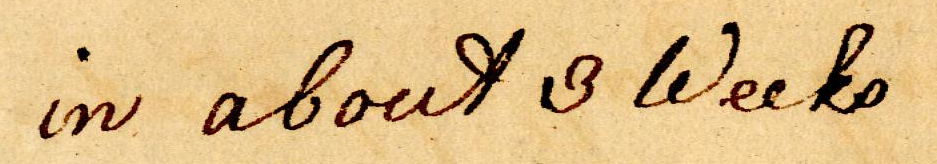in about 3 Weeks
